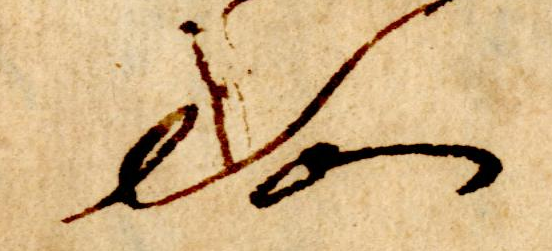To
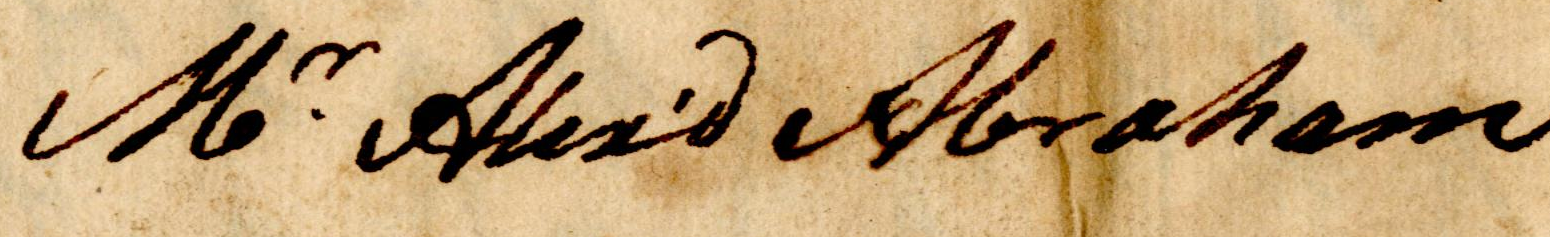Mr. Alex'd Abraham
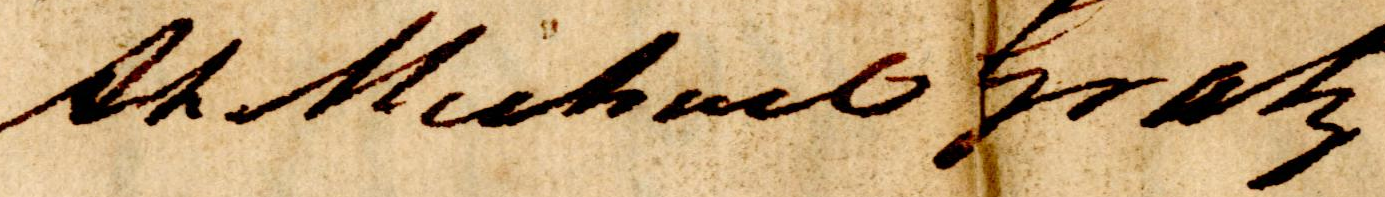At Michael Gratz
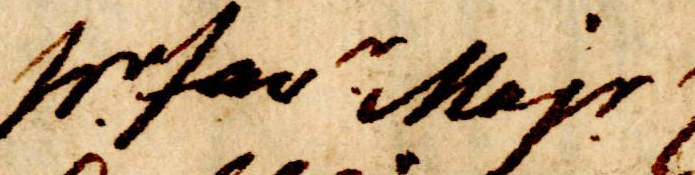p^r. fav^r. Majr.
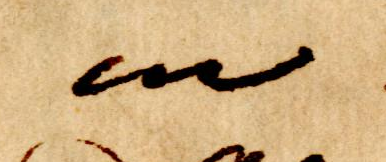in
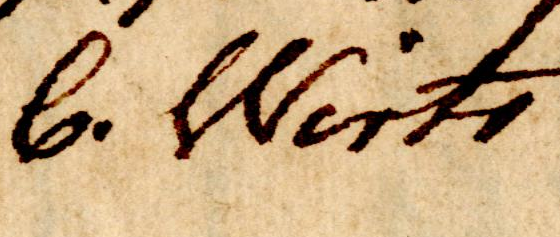C. Wirts
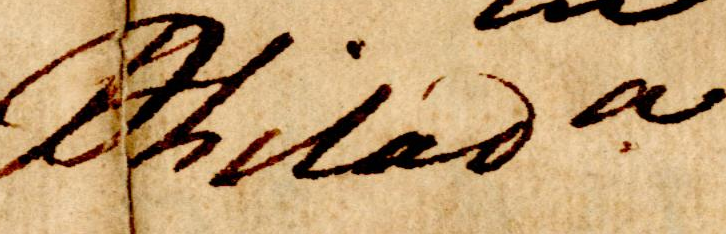Philad^a.
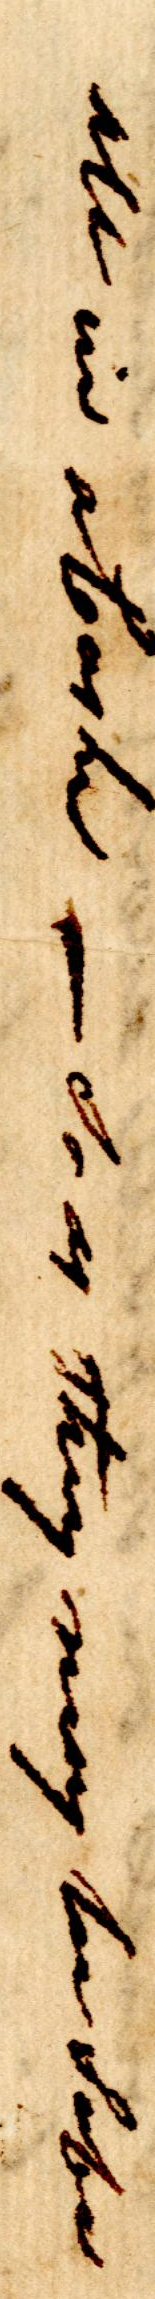all in a Cask- so they may be Safe
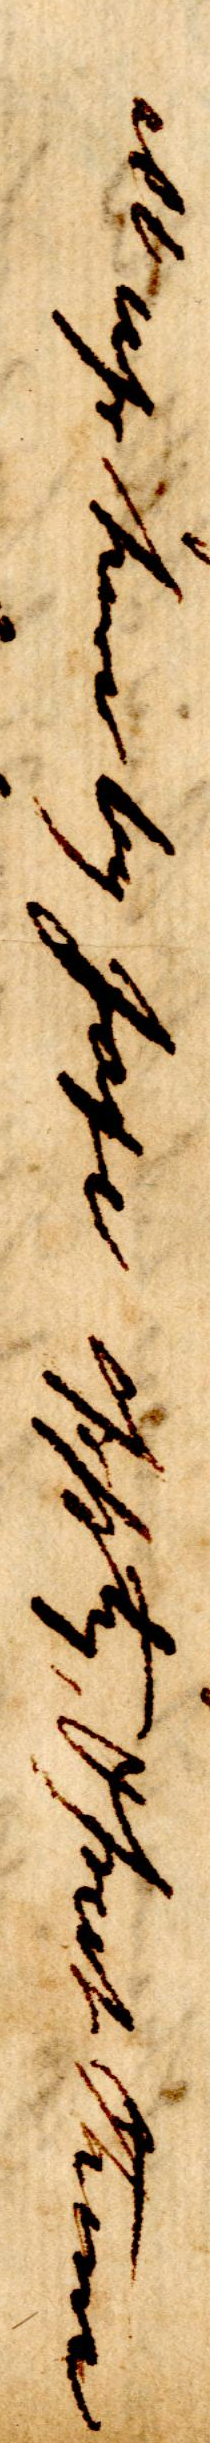all up here by fote oppty & put them
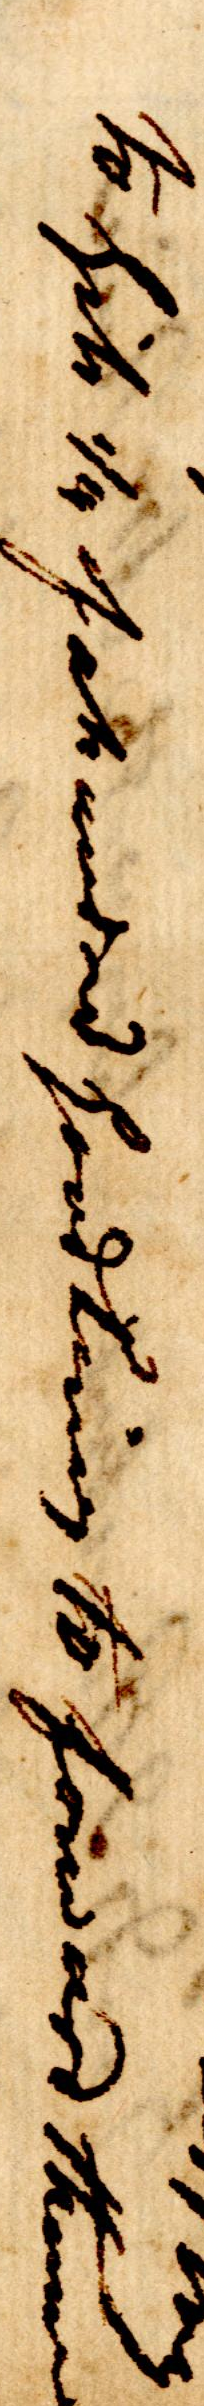to Git 1/4 of a hundred good Lines to forward them
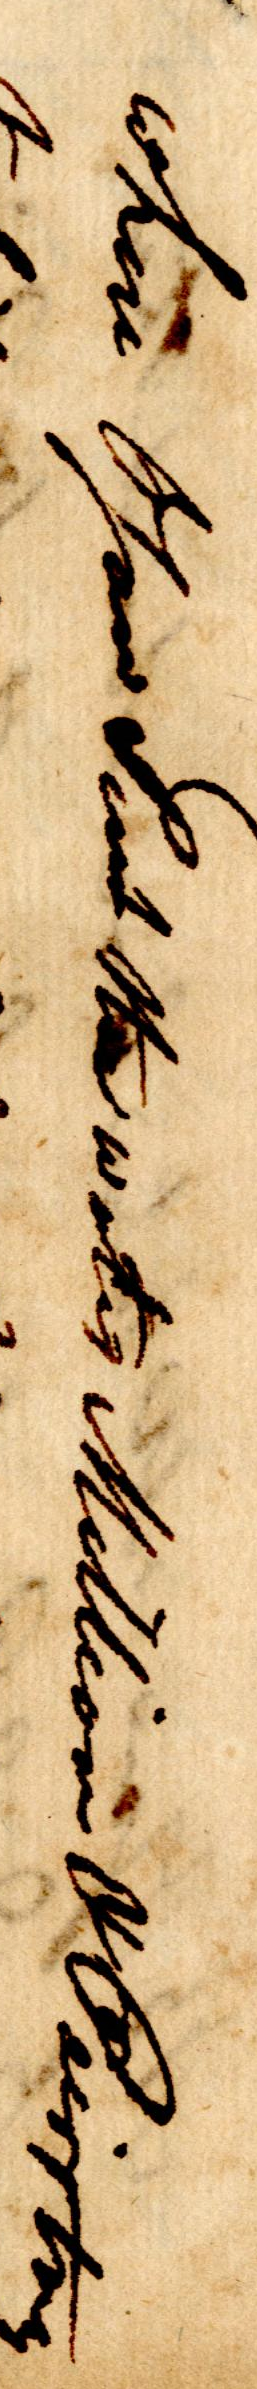where you sent the water Million & Peir try
